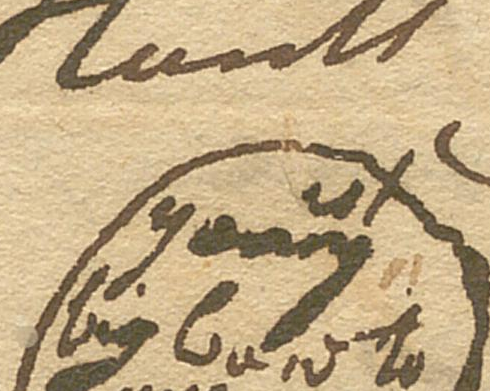young
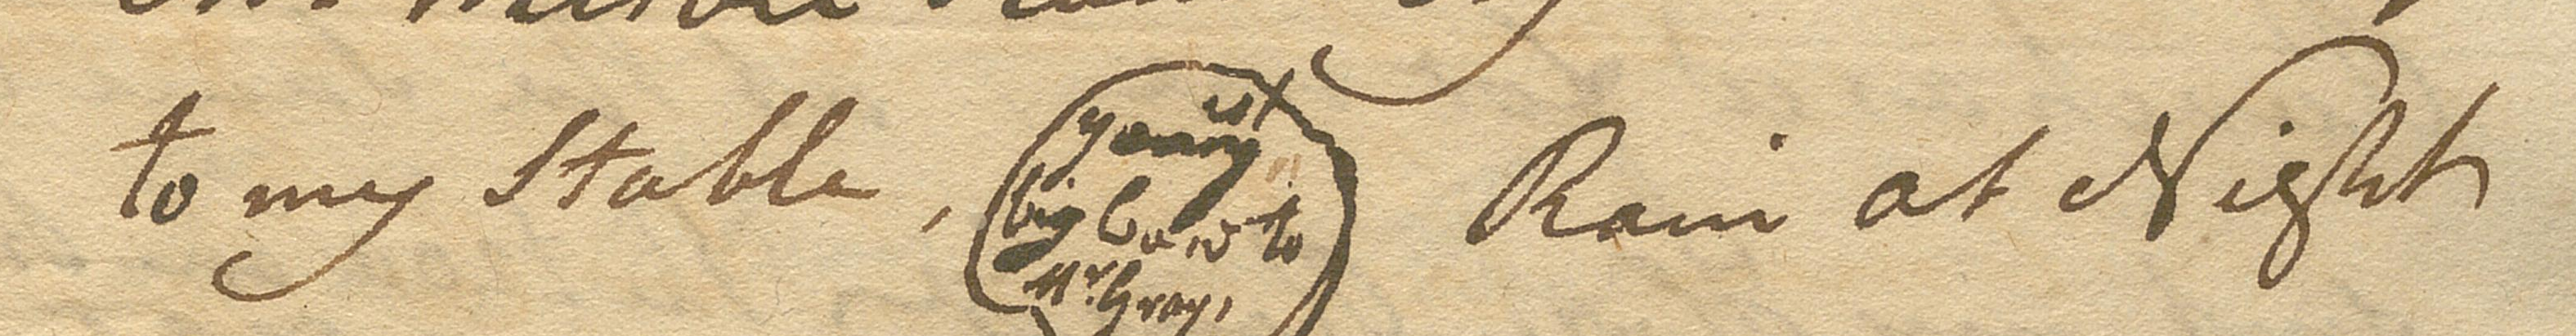to my Stable, big Cow to Rain at Night
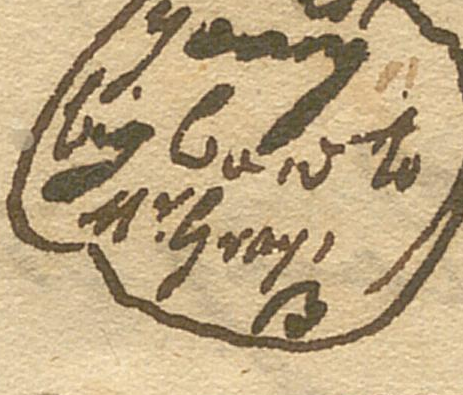M^r. Grays
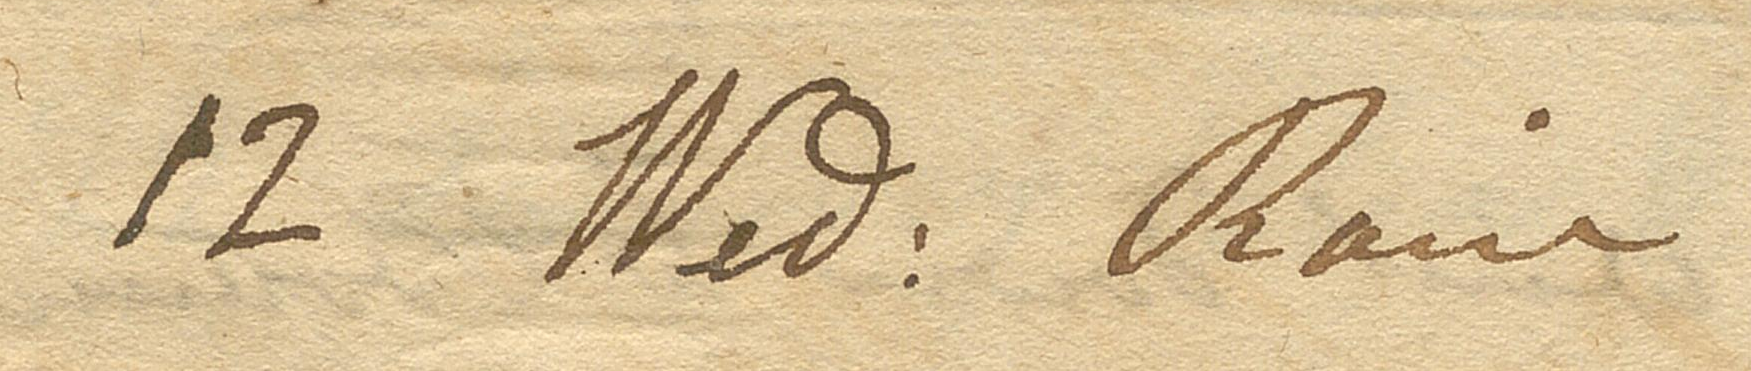12 Wed. Rain
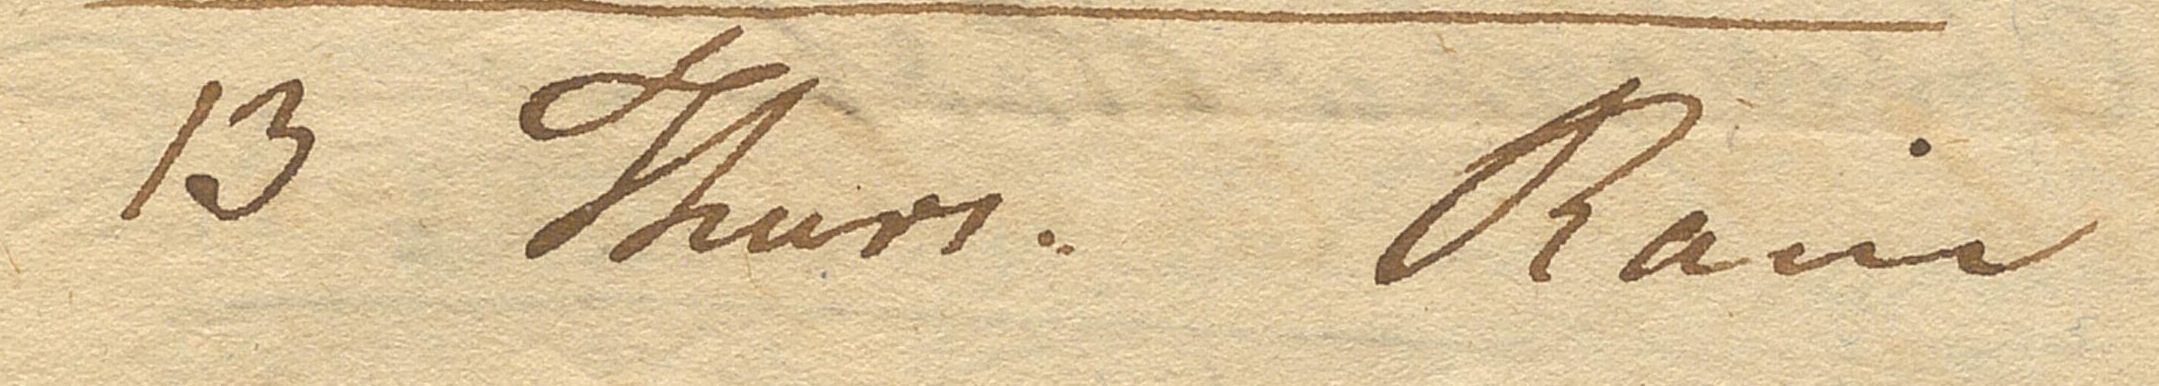13 Thurs. Rain
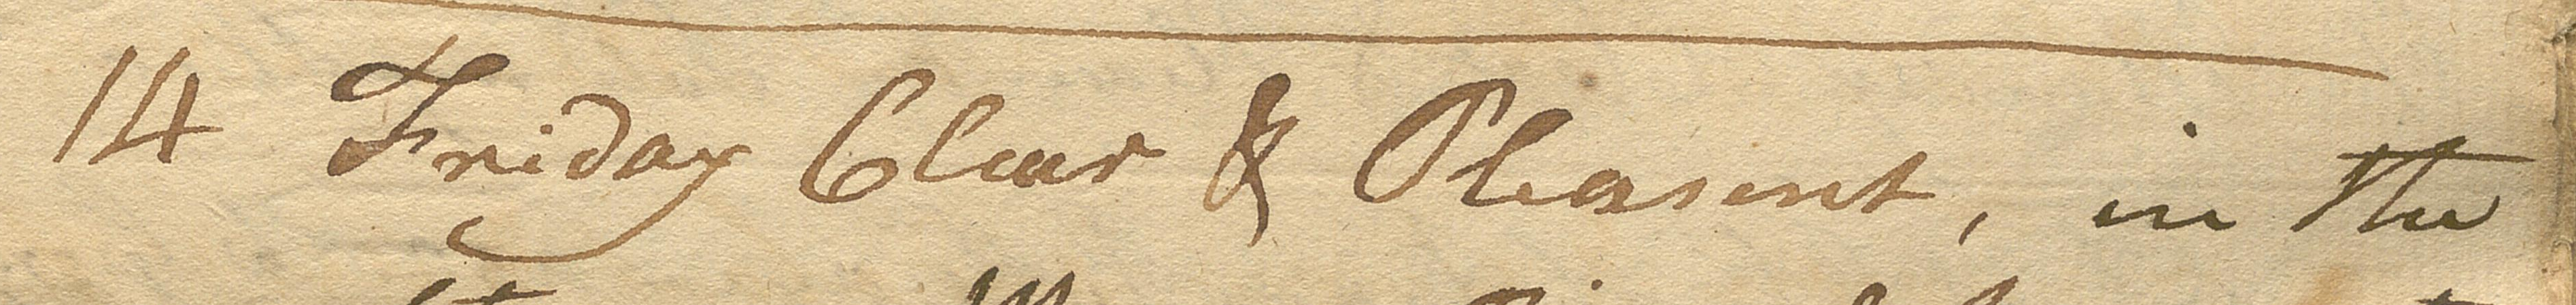14 Friday Clear & Pleasent, in the
